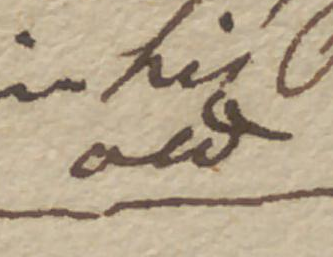old
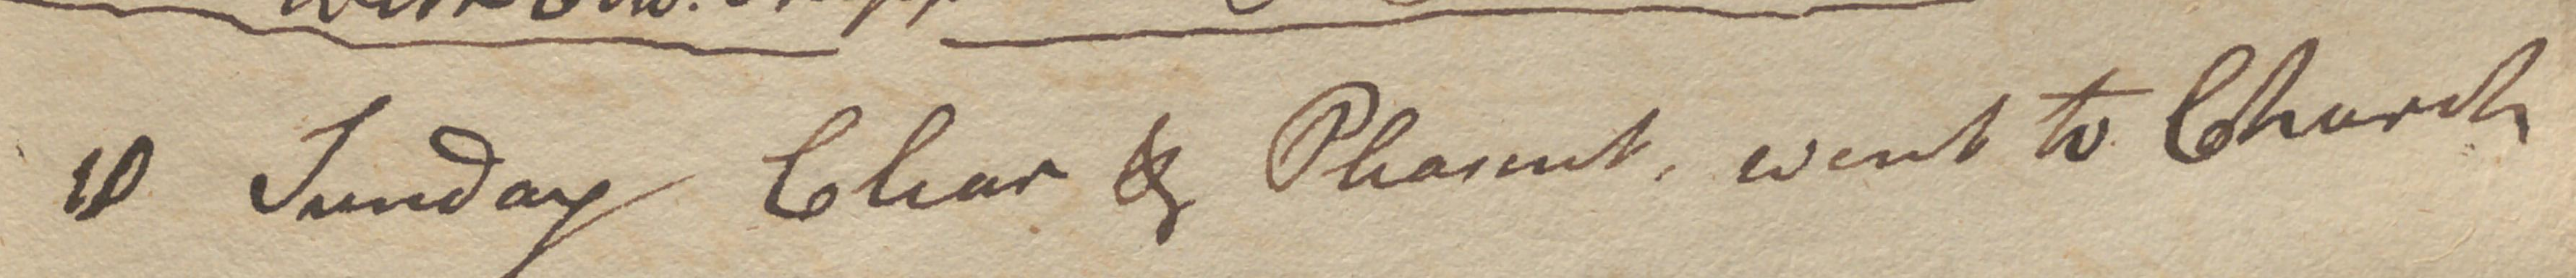10 Sunday Clear & Pleasent, went to Church
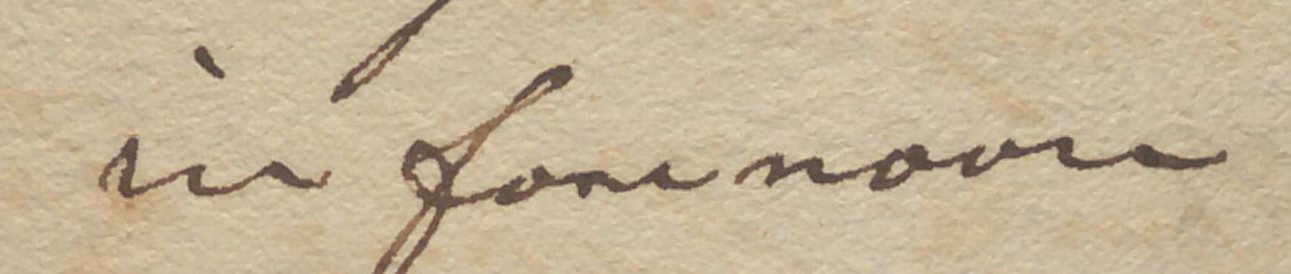in forenoon
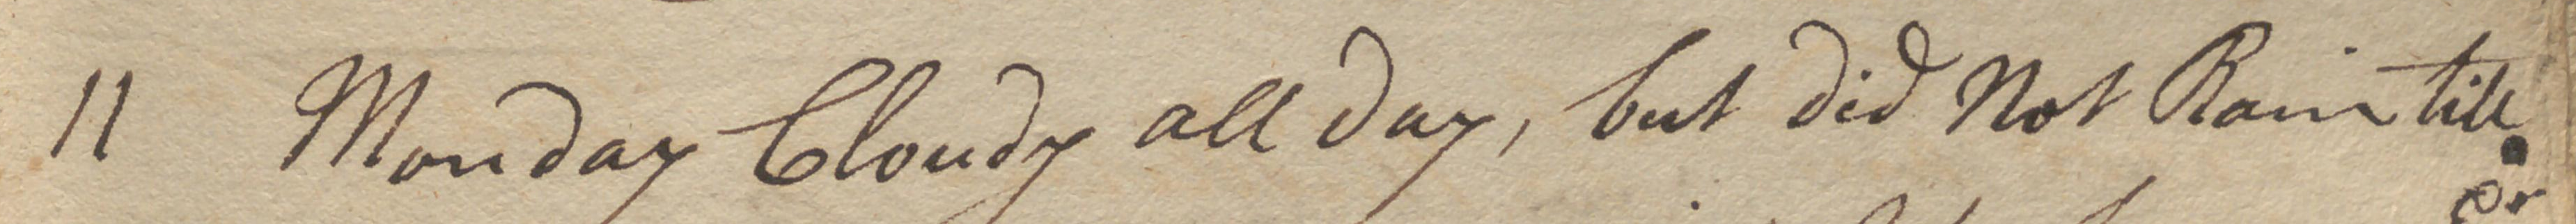11 Monday Cloudy all day, but did Not Rain tile
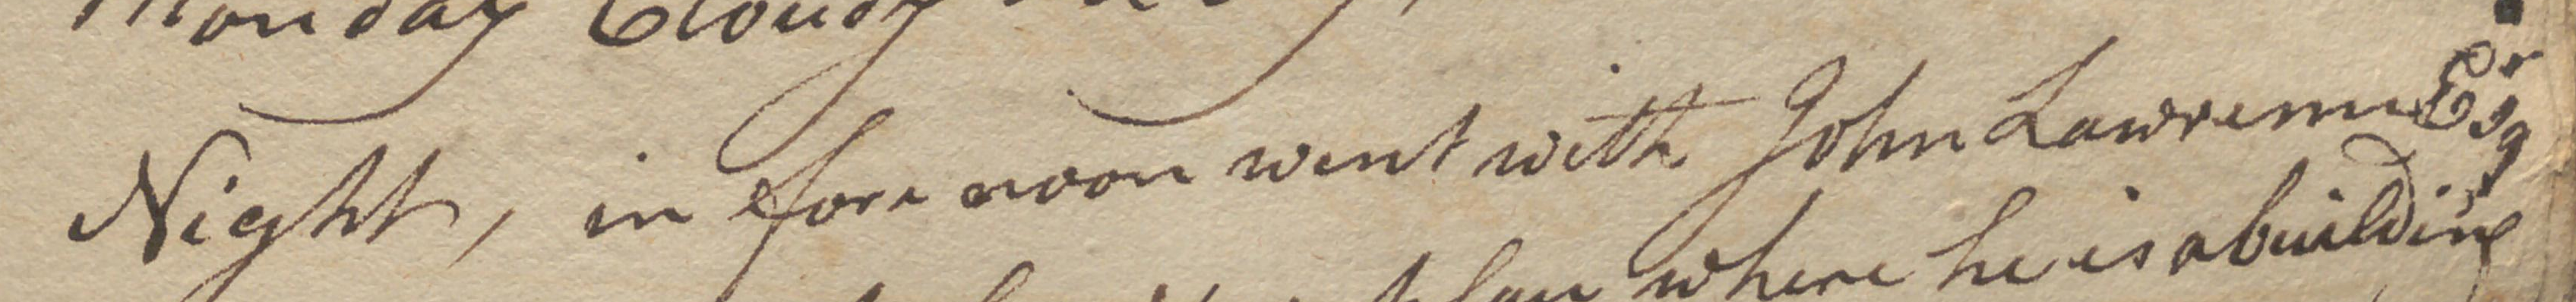Night, in forenoon went with John Lawrence Esq^r
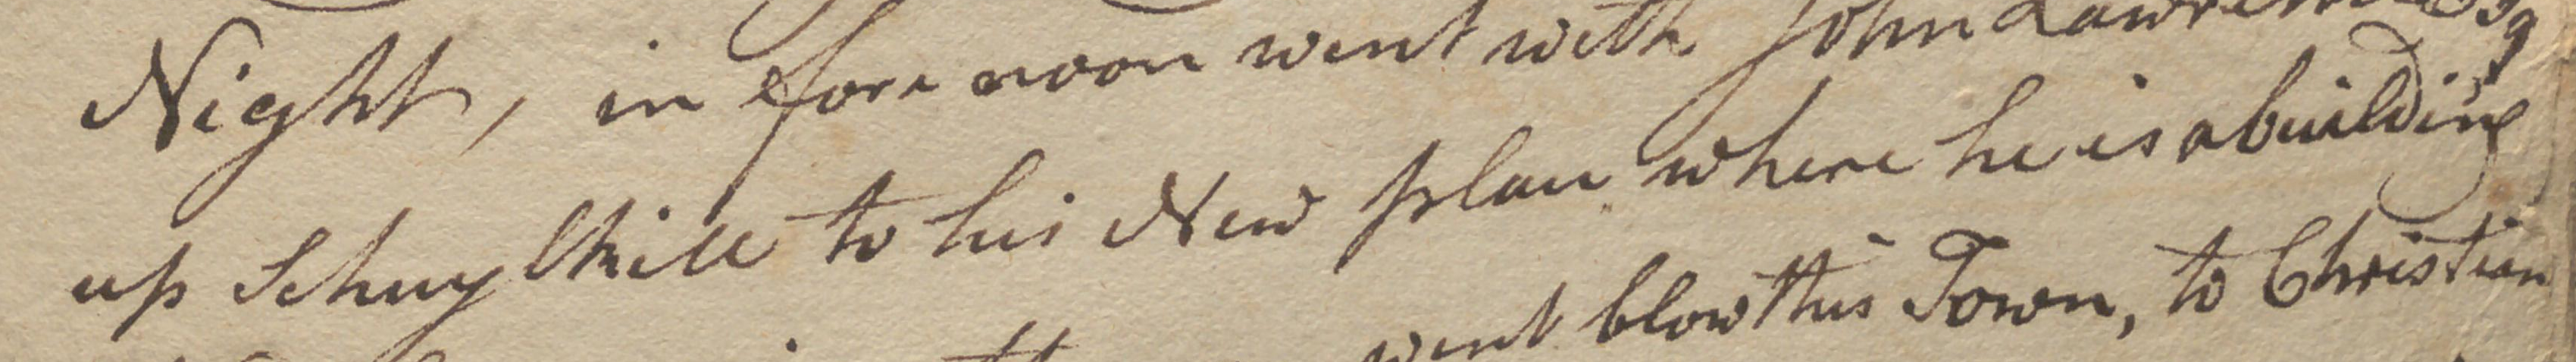up Schuylkill to his New place where he is abuilding
